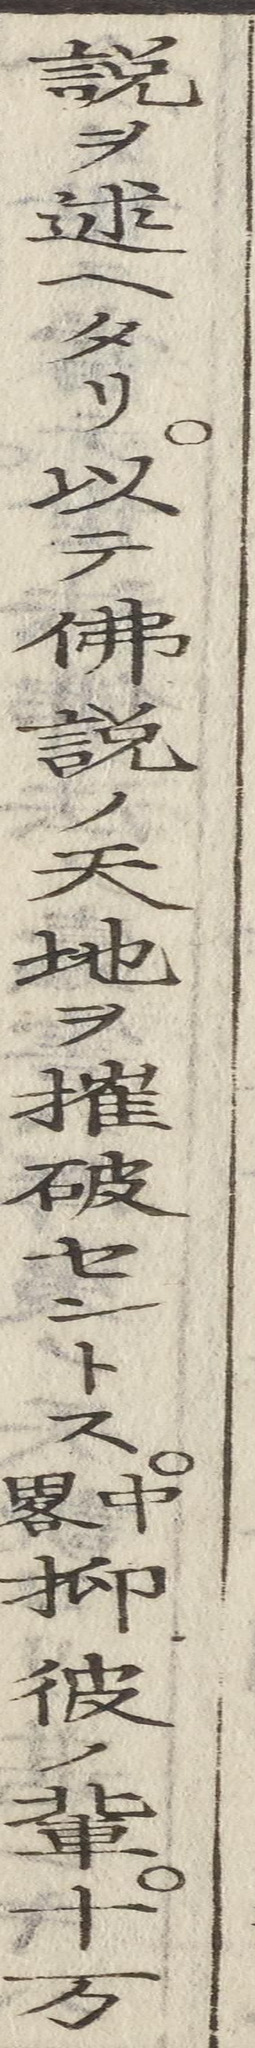説ヲ述ヘタリ。以テ仏説ノ天地ヲ摧破セントス。中略抑彼ノ輩。十万
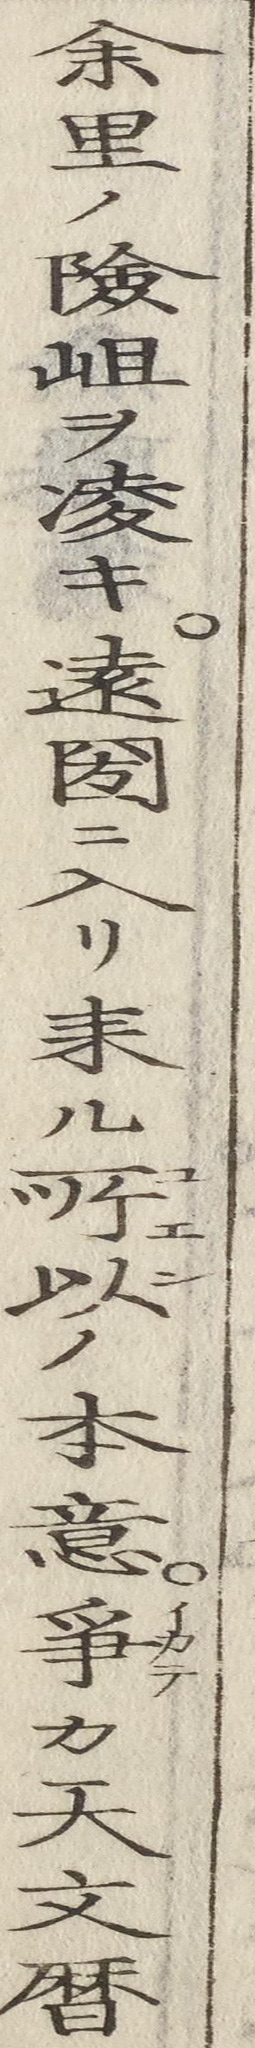余里ノ険阻ヲ凌キ。遠国ニ入リ来ル所以ノ本意。争カ天文暦
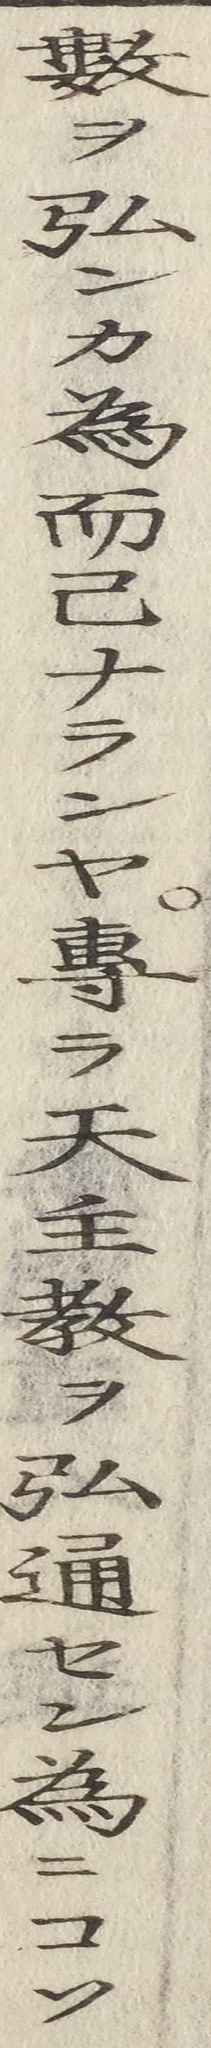数ヲ弘ンカ為而己ナランヤ。専ラ天主教ヲ弘通セン為ニコソ
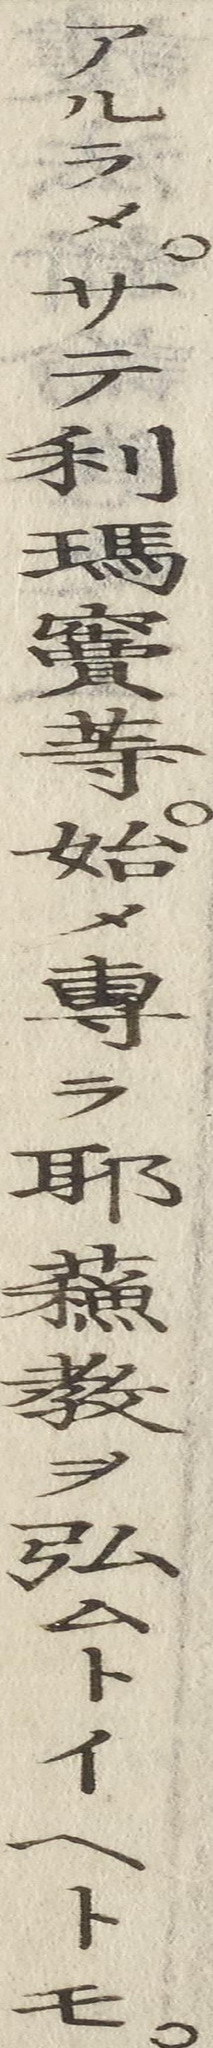アルラメ。サテ利瑪竇等。始メ専ラ耶蘇教ヲ弘ムトイヘトモ。
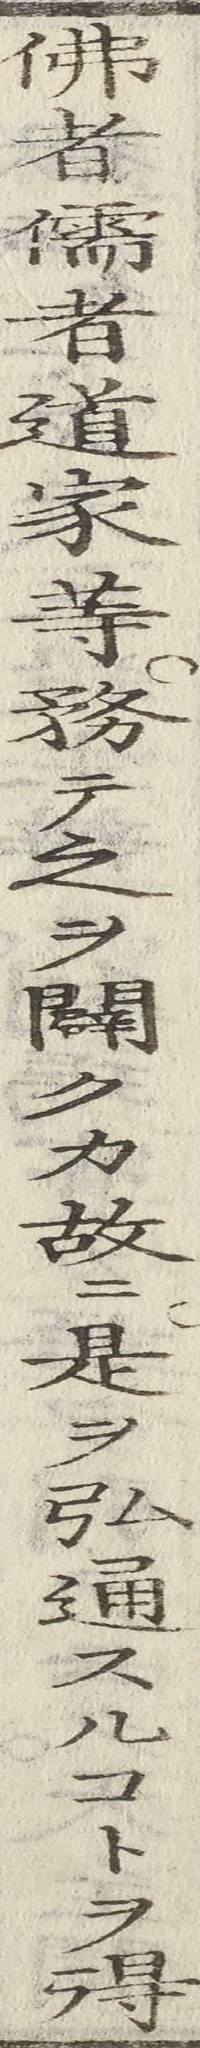仏者儒者道家等。務テ之ヲ闢クカ故ニ。是ヲ弘通スルコトヲ得
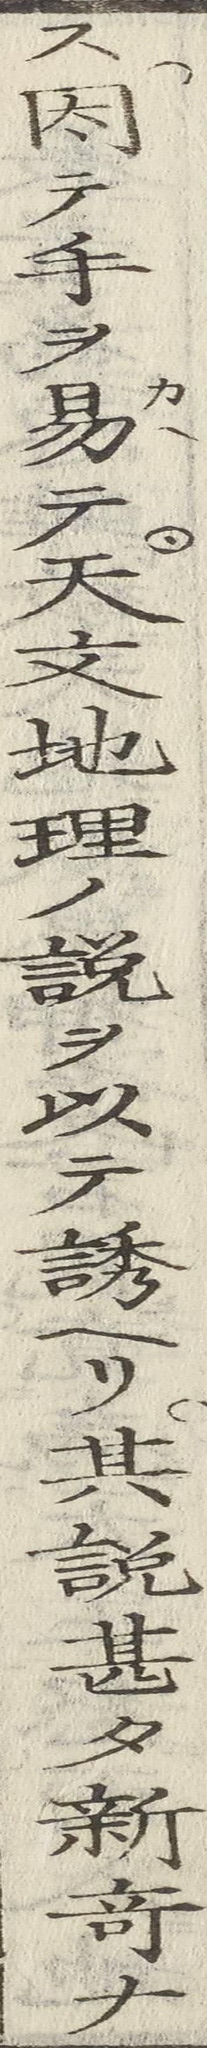ス因テ手ヲ易テ。天文地理ノ説ヲ以テ誘ヘリ。其説甚タ新奇ナ
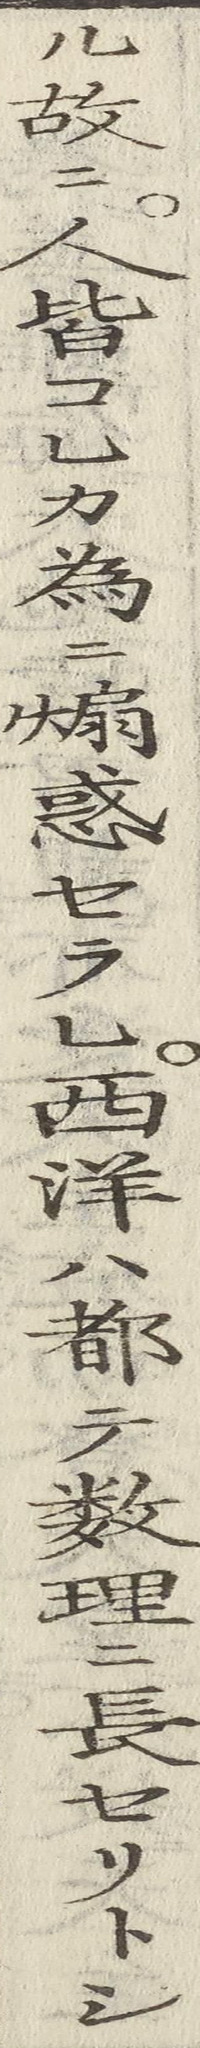ル故ニ。人皆コレカ為ニ煽惑セラレ。西洋ハ都テ数理ニ長セリトシ
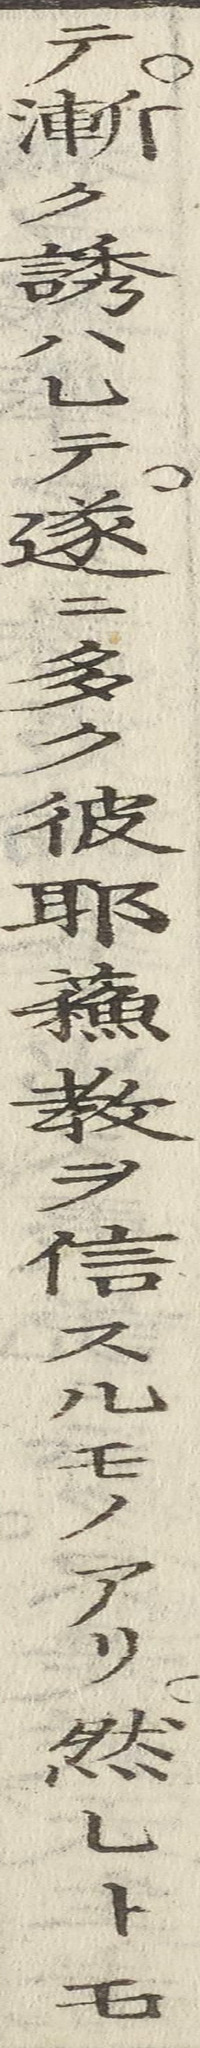テ。漸ク誘ハレテ。遂ニ多ク彼耶蘇教ヲ信スルモノアリ。然レトモ
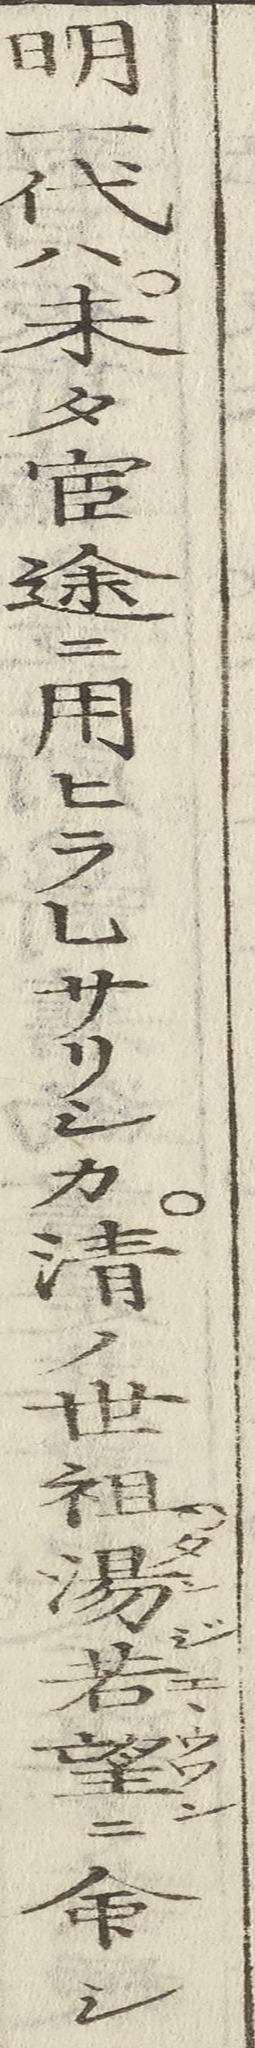明一代ハ。未タ宦途ニ用ヒラレサリシカ。清ノ世祖。湯若望ニ命シ
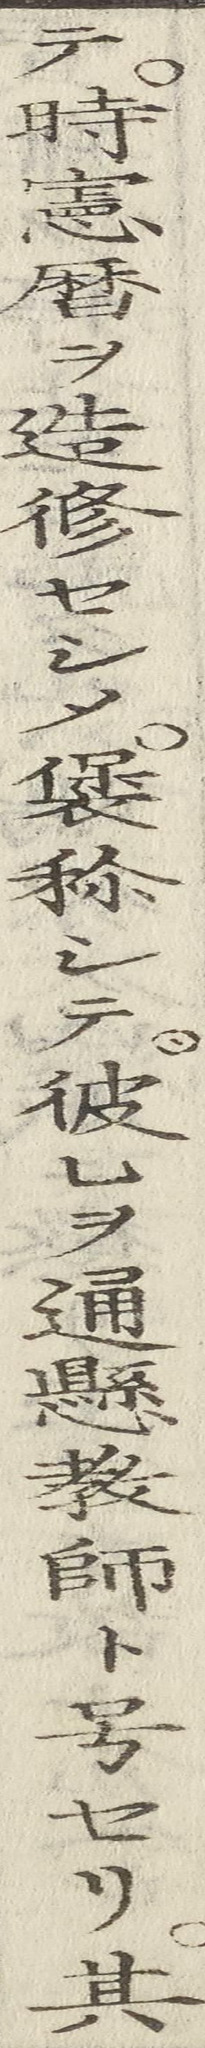テ。時憲暦ヲ造修セシメ。褒称シテ。彼レヲ通懸教師ト号セリ。其
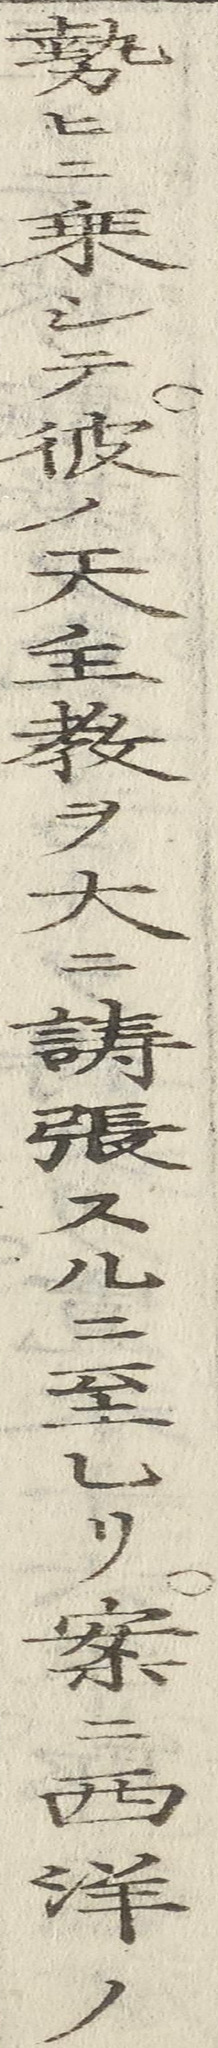勢ヒニ乗シテ。彼ノ天主教ヲ大ニ譸張スルニ至レリ。案ニ西洋ノ
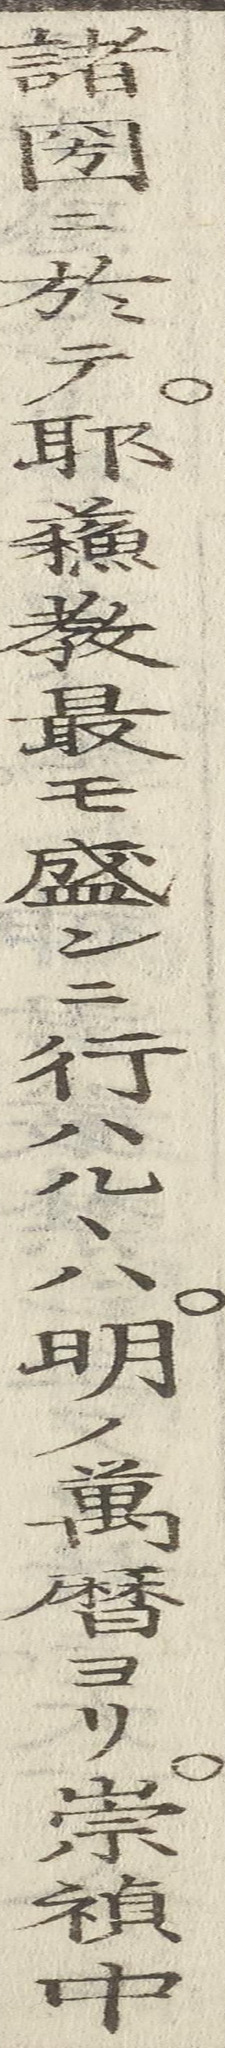諸国ニ於テ。耶蘇教最モ盛ンニ行ハルヽハ。明ノ万暦ヨリ。崇禎中
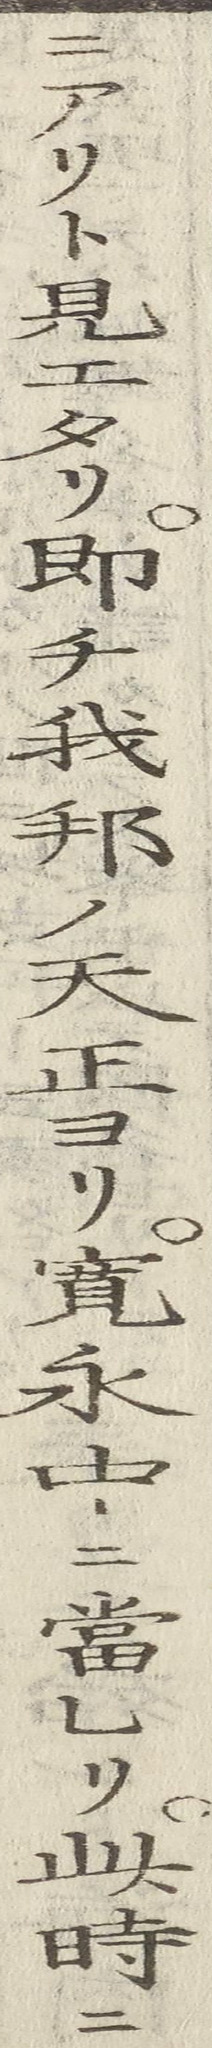ニアリト見エタリ。即チ我邦ノ天正ヨリ。寛永中ニ当レリ。此時ニ
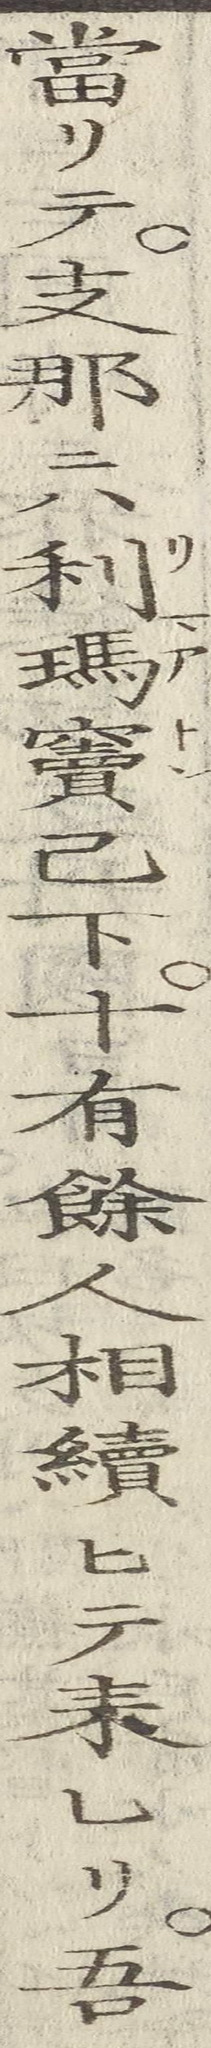当リテ。支那ニハ利瑪竇己下。十有余人相続ヒテ来レリ。吾

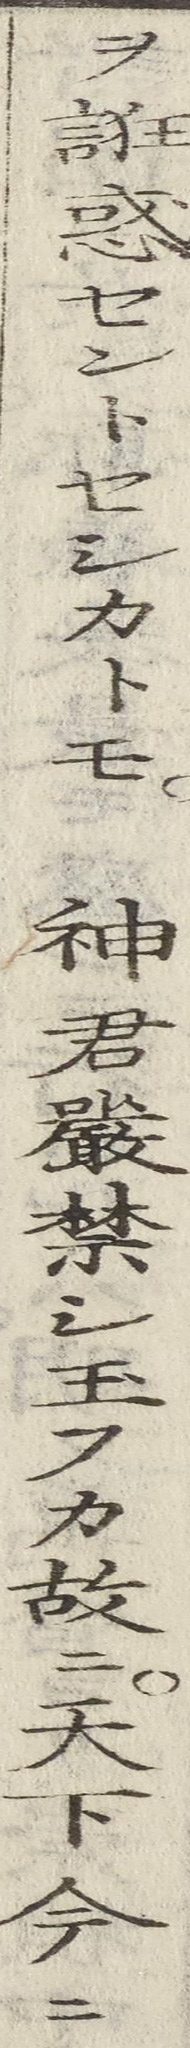ヲ誑惑セントセシカトモ。神君厳禁シ玉フカ故ニ。天下今ニ
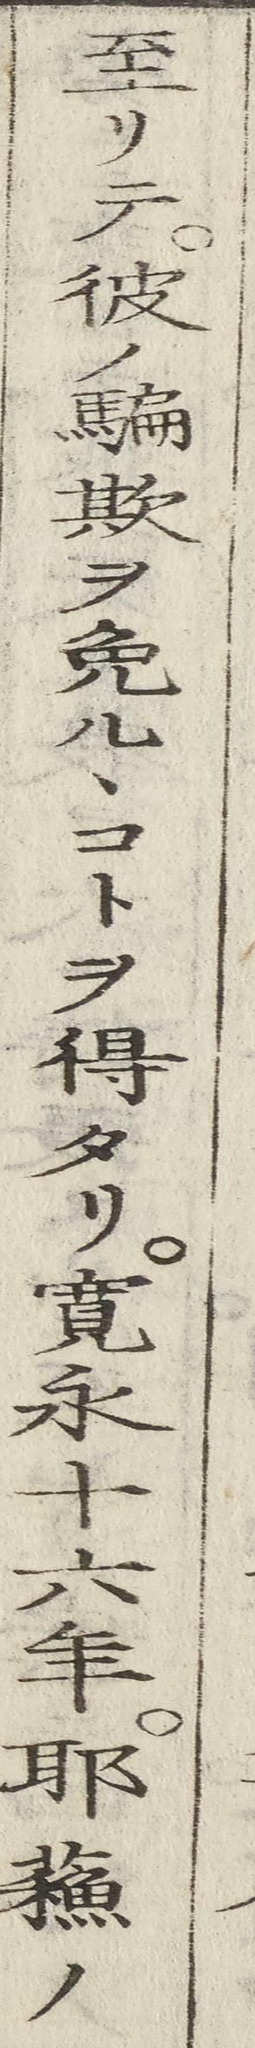至リテ。彼ノ騙欺ヲ免ルヽコトヲ得タリ。寛永十六年。耶蘇ノ
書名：護法新論　上
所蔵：東京大学地震研究所図書室 Earthquake Research Institute Library, The University of Tokyo, JAPAN
